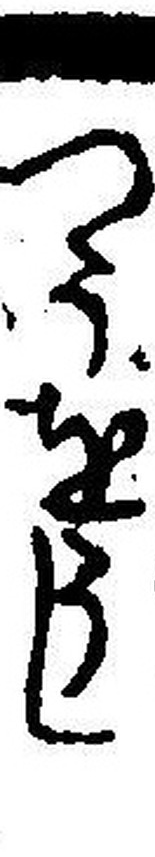つうをうし
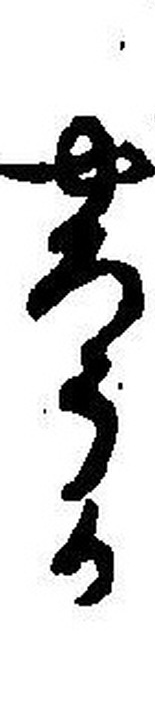やろうか
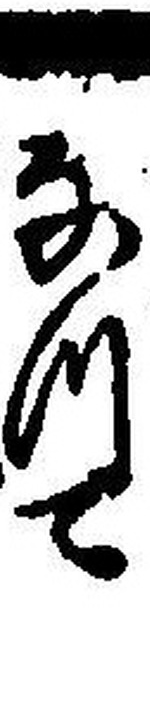なつて
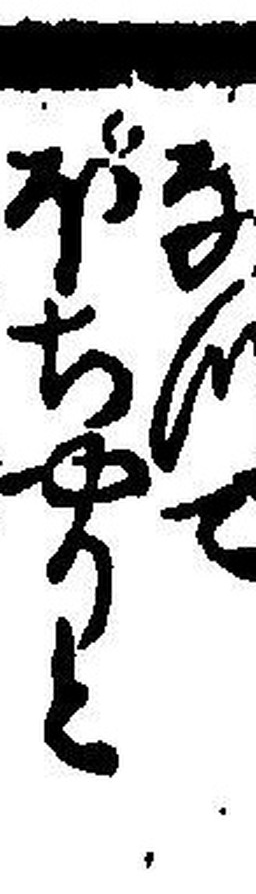ぽちやりと
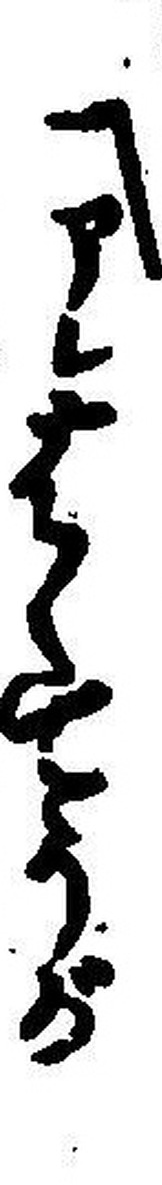〽アレはくてうが
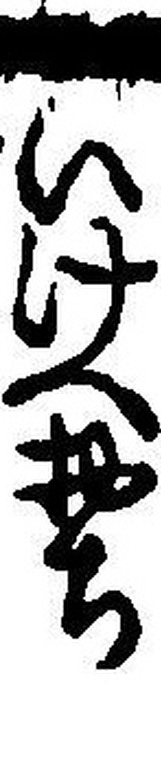いけへおち
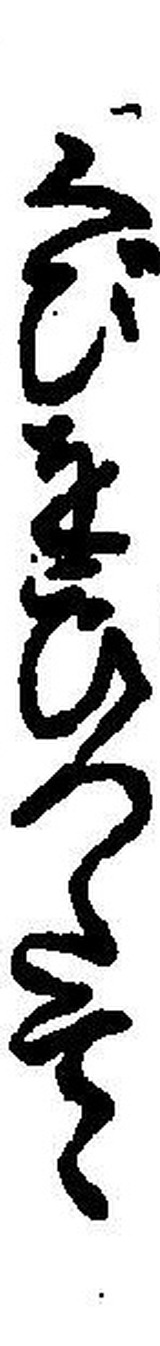くびをひつたてゝ
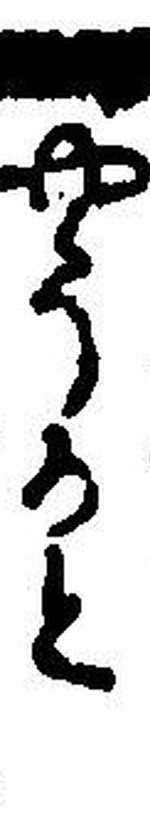やうかと
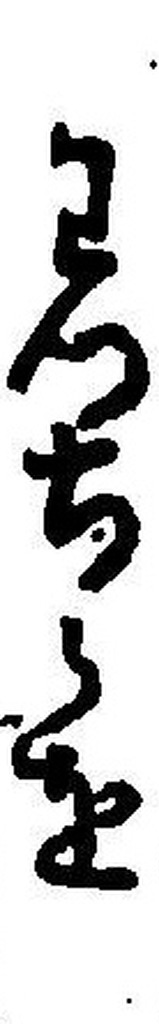わつちらを
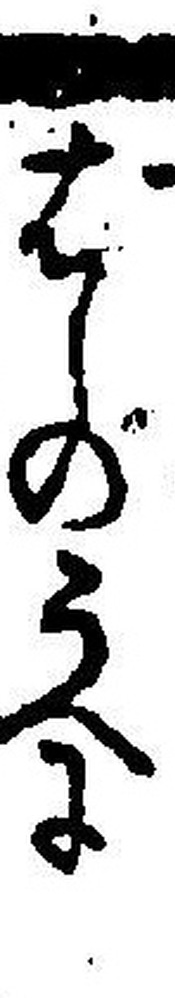はしのうへに
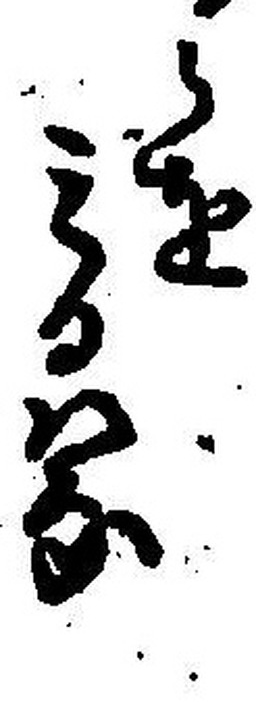みるはな
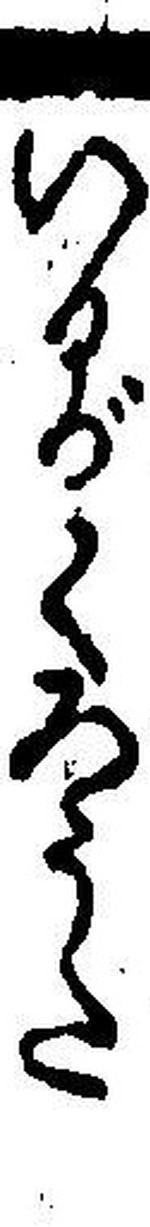いるがくろうた

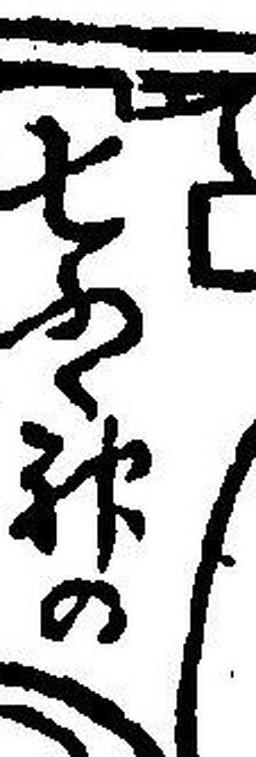七ふく神の
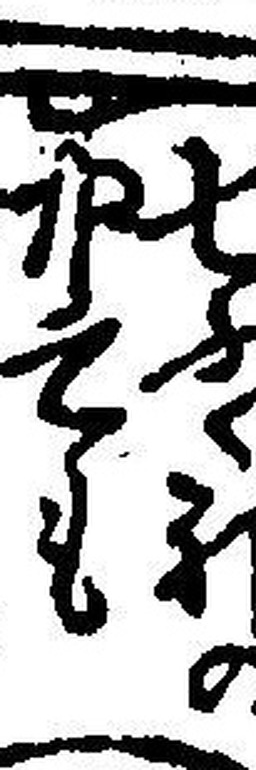中ても
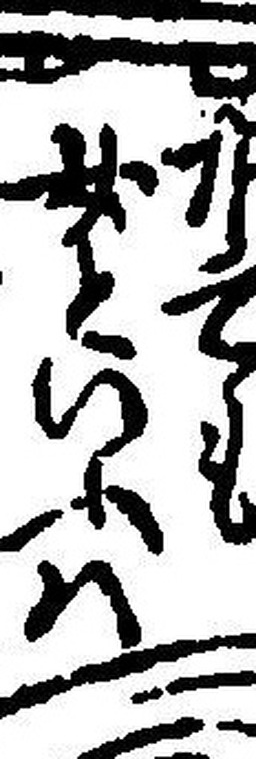女といふは
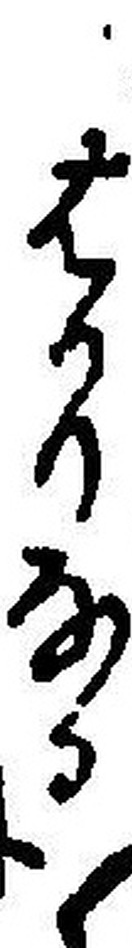はかりなる
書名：徳若水縁起金性 / 樹下石上作
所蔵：東京大学総合図書館 General Library in the University of Tokyo, JAPAN
